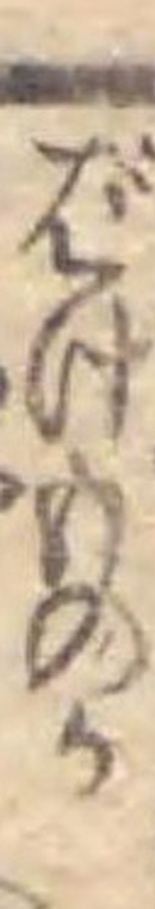ばけものか
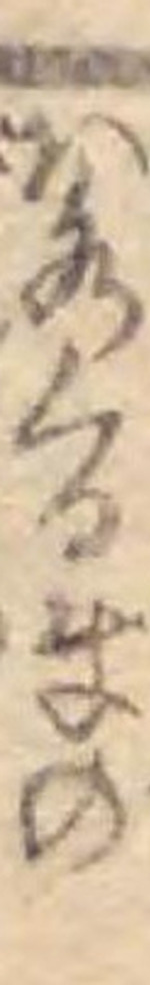は水くるまの
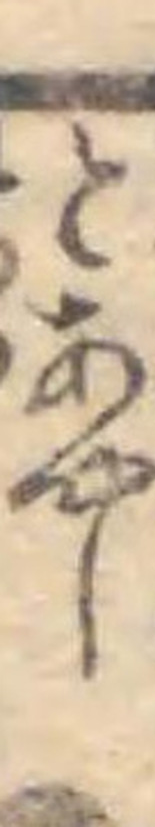とあやし
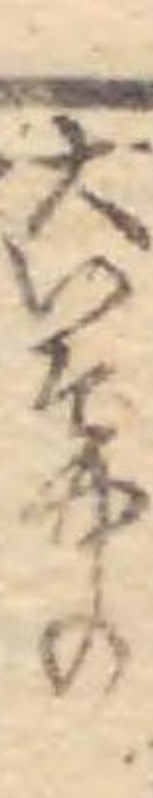大いそ中の
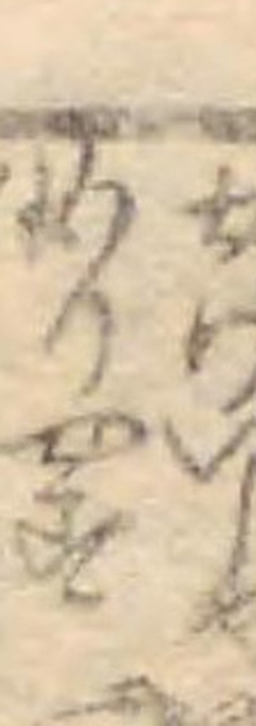めりやす
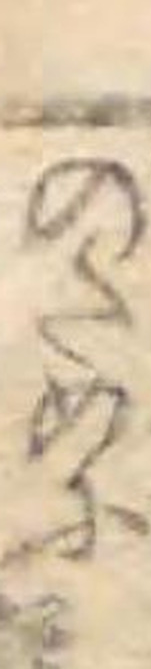のために
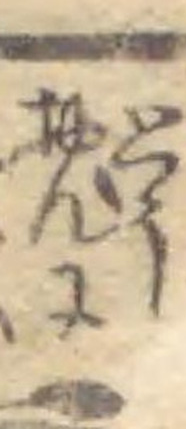おんに
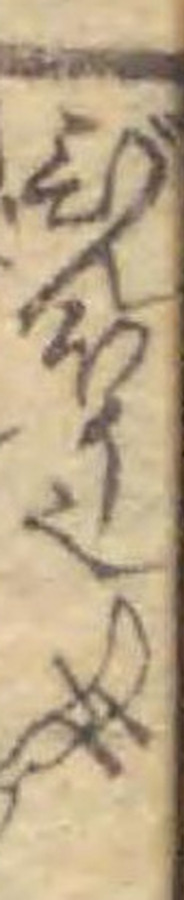びんほう也
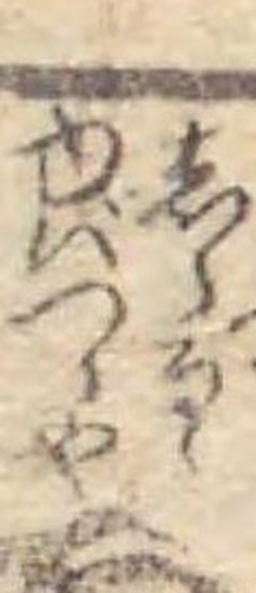ゆばつらや
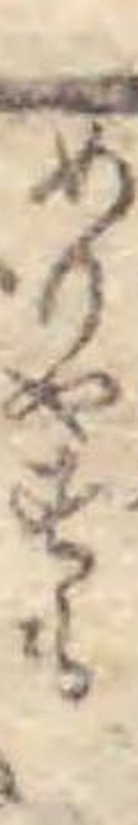めりやすも
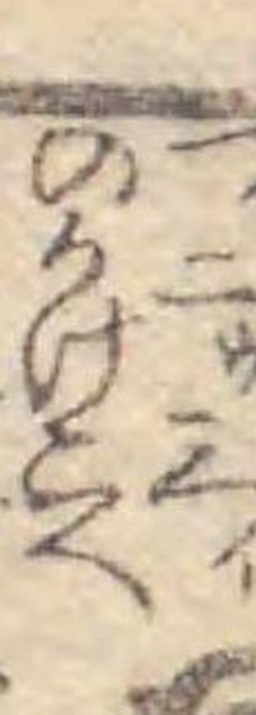のかけこへ
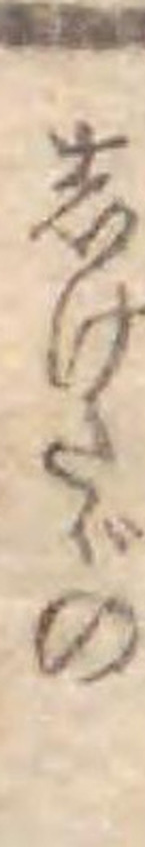しけたゞの
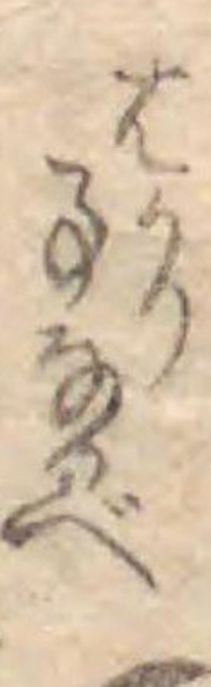事なるべ

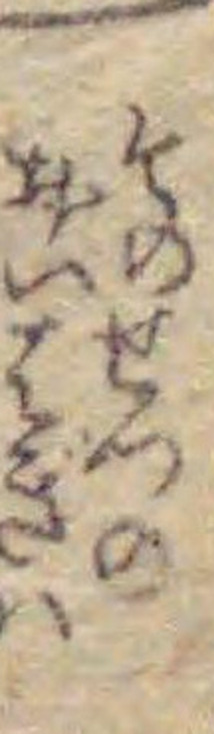おいはぎは
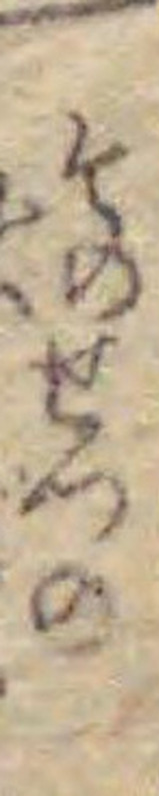そのせつの
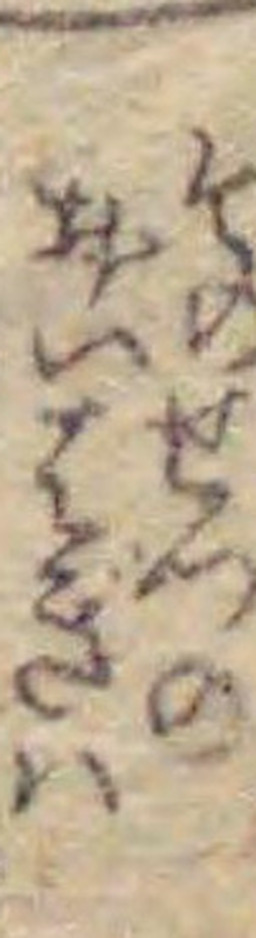おいはぎは
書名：文武二道万石通 : 3巻
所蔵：国立国会図書館 National Diet Library, JAPAN
